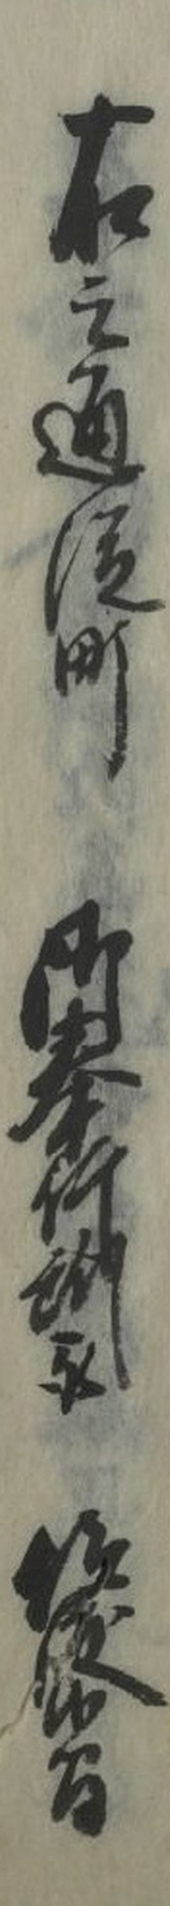右之通従町御奉行所被仰渡候間

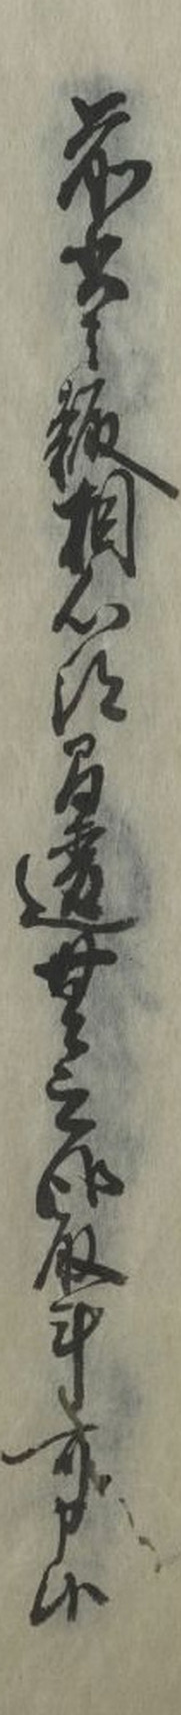前書之趣相心得間違無之様取計可申候
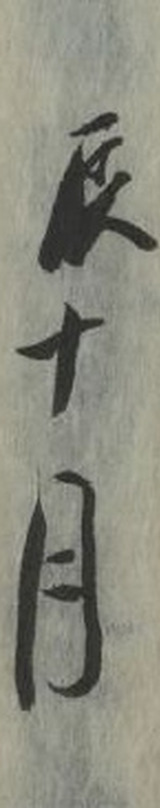辰十月
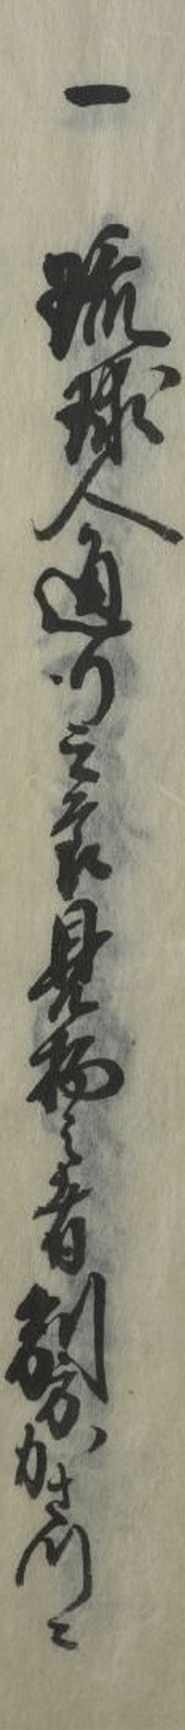一琉球人通り之節見物之者制方かさつに
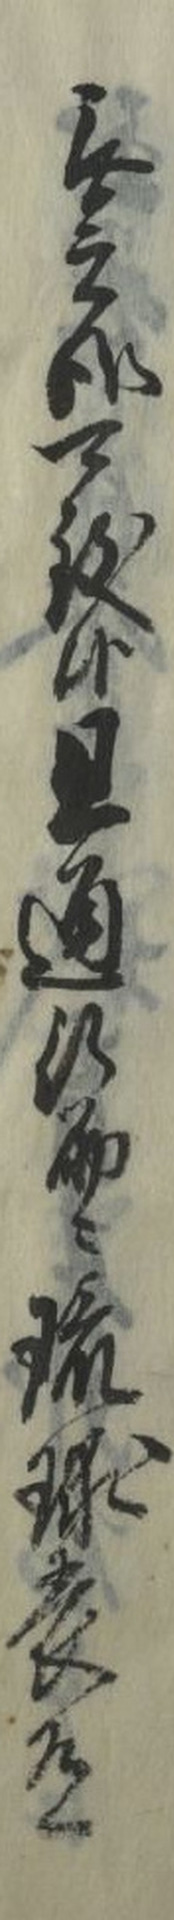無之様可致候且通行筋に琉球表有
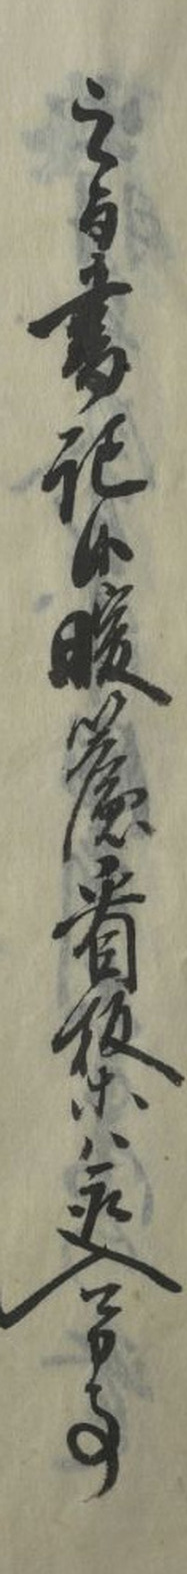之旨書記候暖簾看板等取入可申事
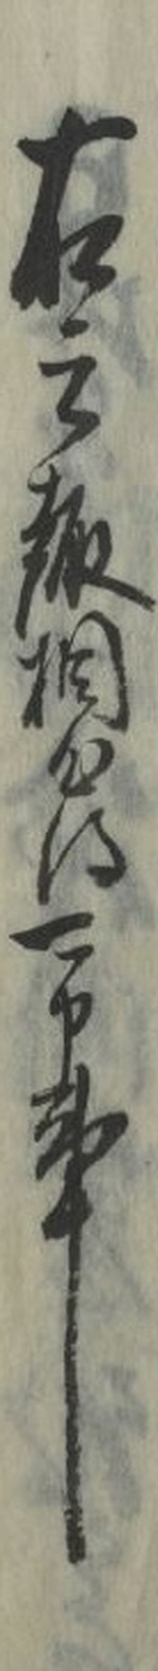右之趣相心得可申事
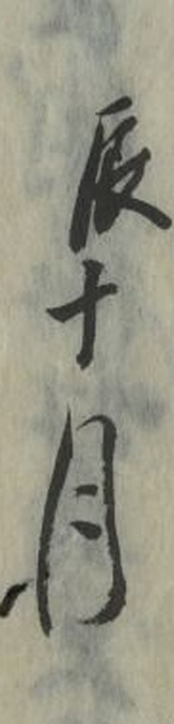辰十月
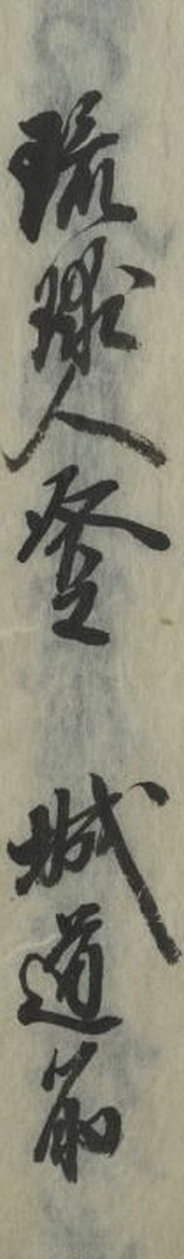琉球人登城道筋
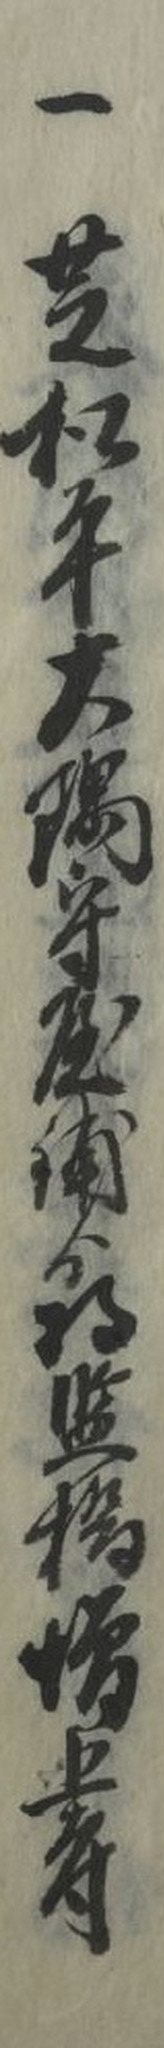一芝松平大隅守屋鋪ゟ将監橋増上寺

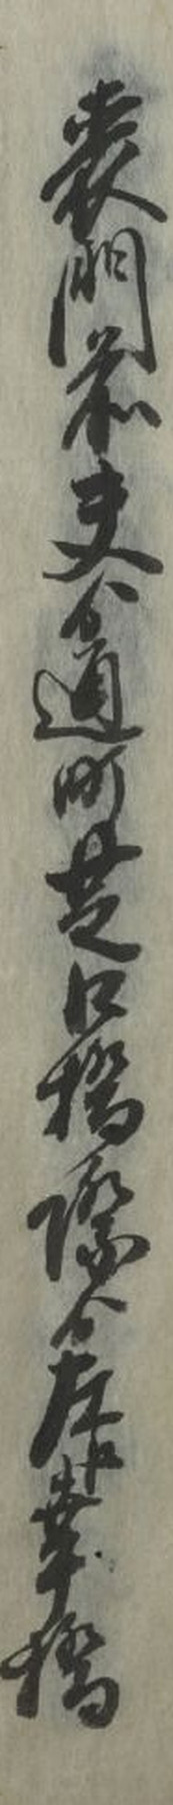表門前夫ゟ通町芝口橋際ゟ左え幸橋
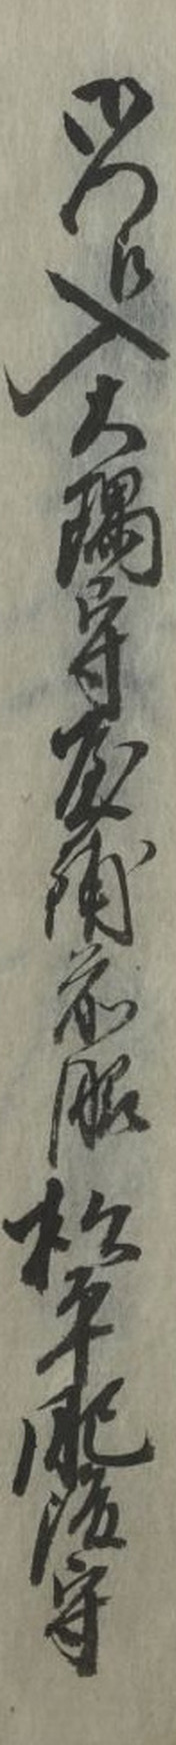御門え入大隅守屋鋪前脇松平肥後守
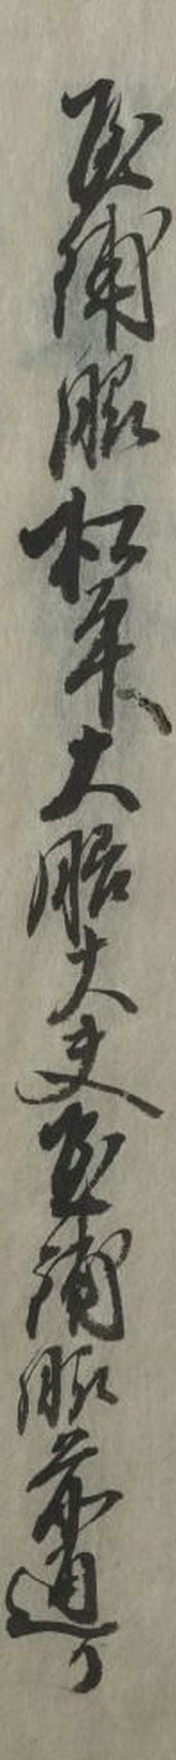屋鋪脇松平大膳大夫屋鋪脇前通り
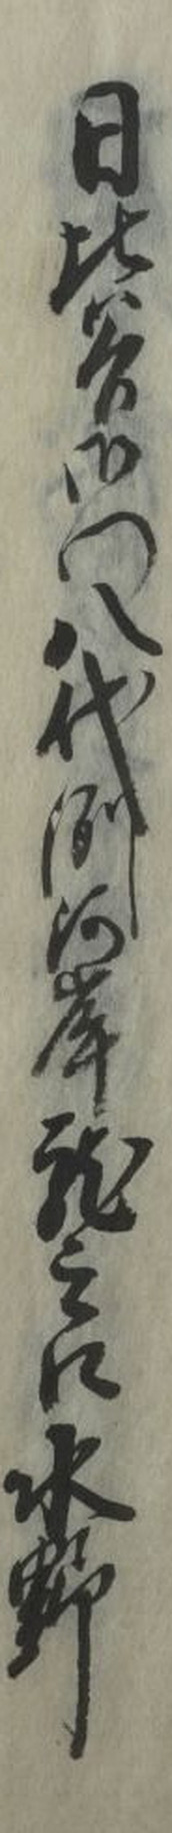日比谷御門八代洲河岸龍之口水野
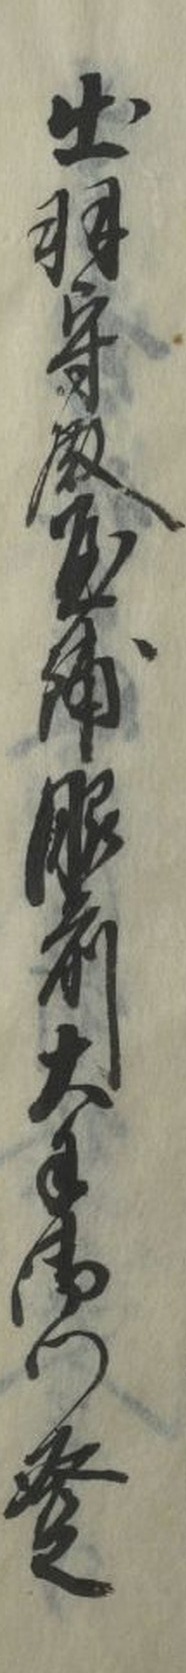出羽守殿屋鋪脇前大手御門登
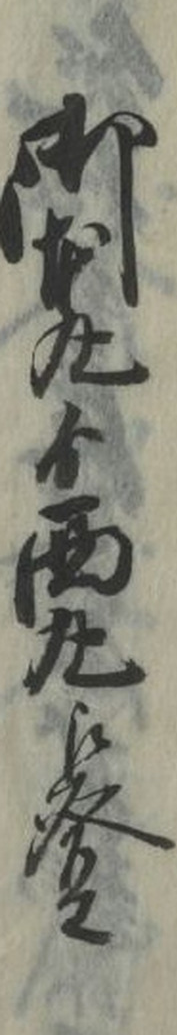御本丸ゟ西丸え登
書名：天保三壬辰年・琉球人参府・弐朱吹立御触写
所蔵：University of the Ryukyus Library
